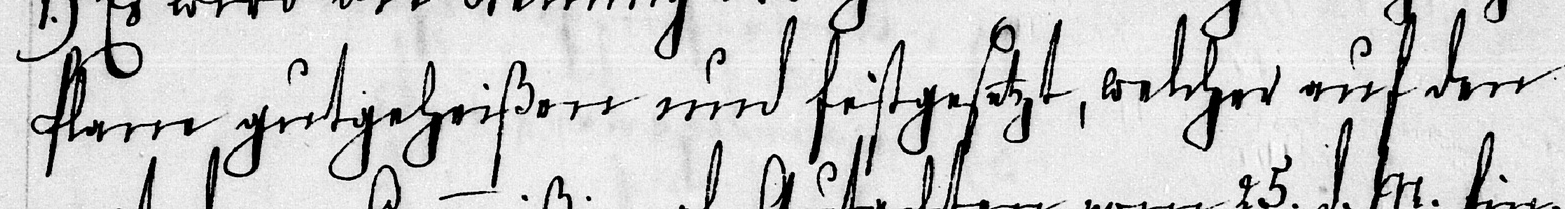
Plane gutgeheißen und festgesetzt, welcher auf den
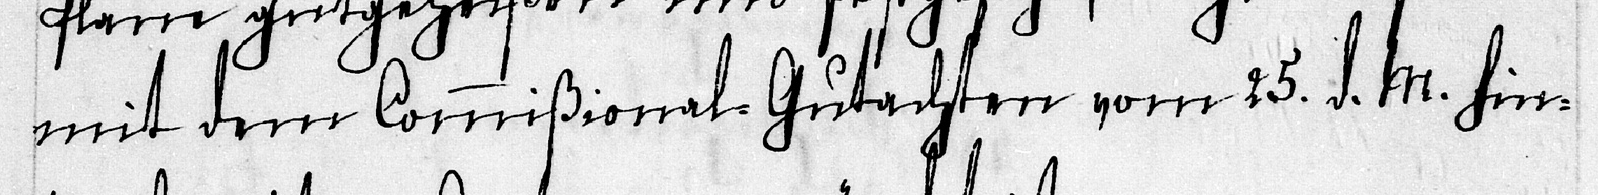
mit dem Commißional-Gutachten vom 25. d. M. hin¬
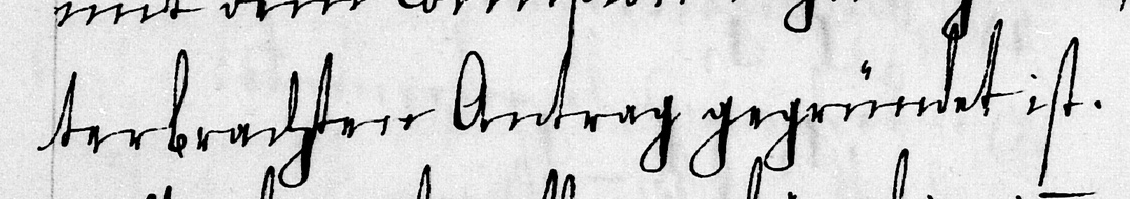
terbrachten Antrag gegründet ist.
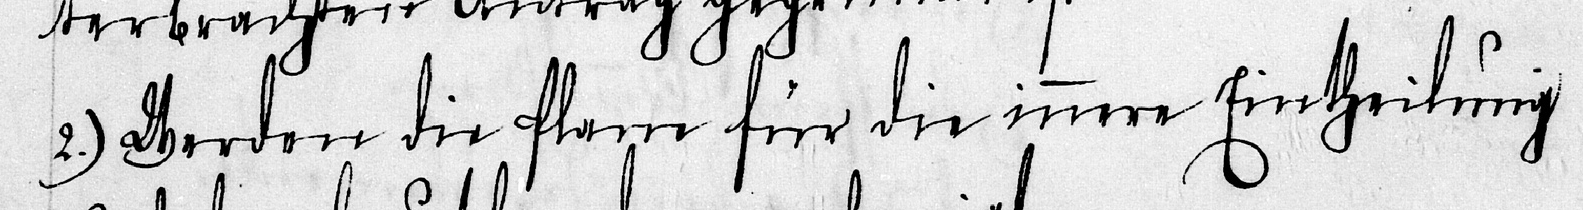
2.) Werden die Plane für die innere Eintheilung
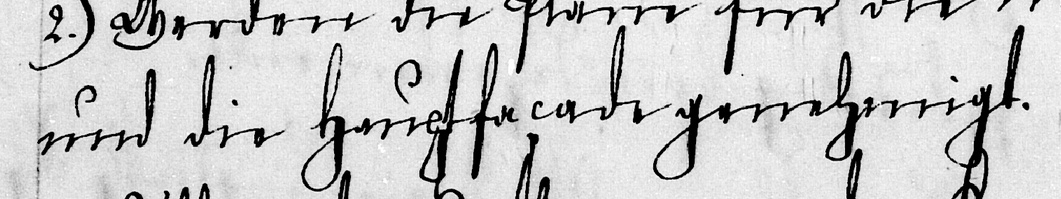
und die Hauptfacade genehmigt.
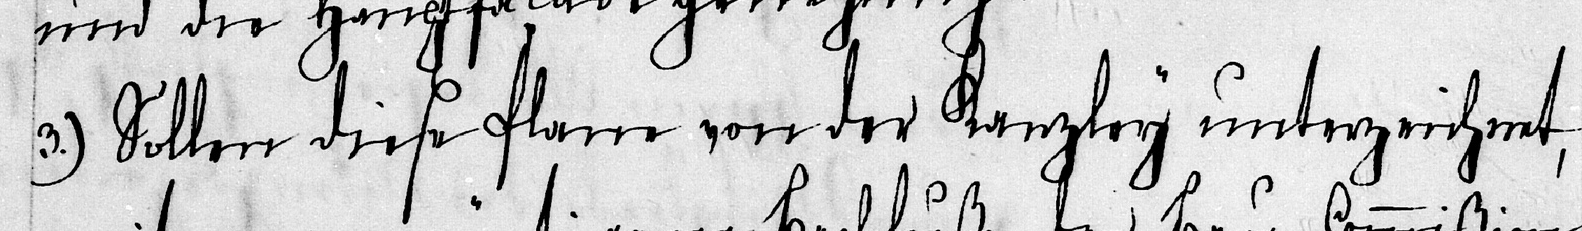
3.) Sollen diese Plane von der Kanzley unterzeichnet,
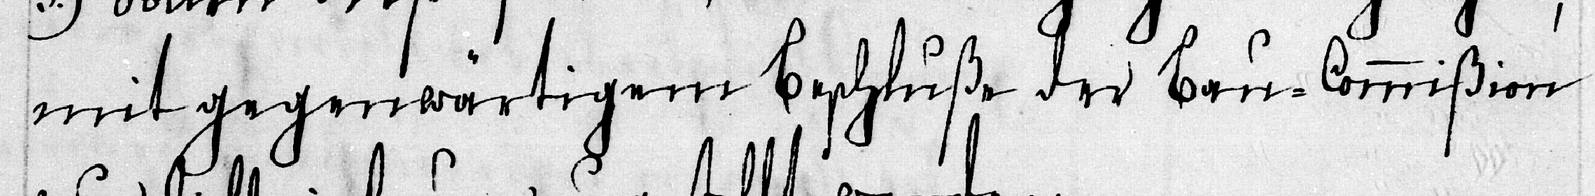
mit gegenwärtigem Beschluße der Bau-Commißion
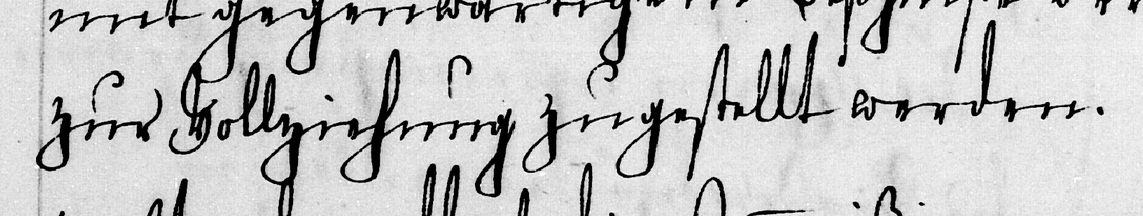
zur Vollziehung zugestellt werden.
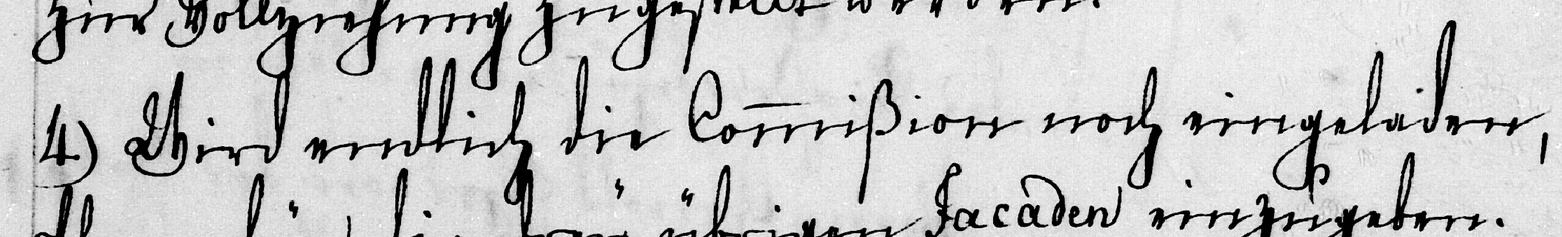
4.) Wird endlich die Commißion noch eingeladen,
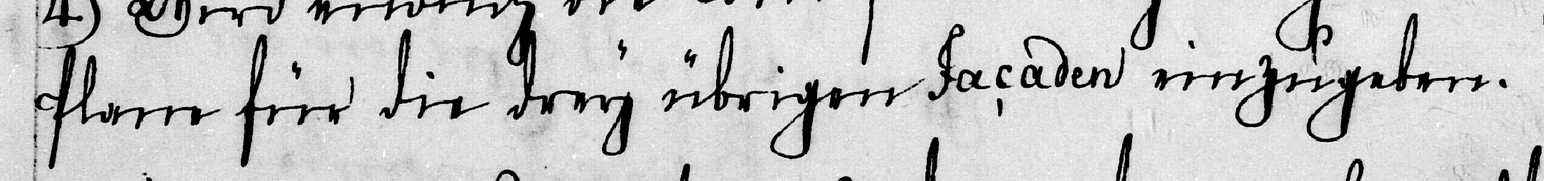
Plane für die drey übrigen Facaden einzugeben.
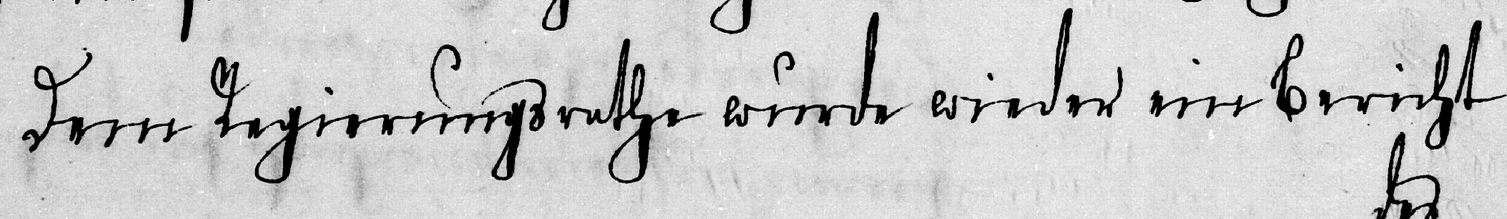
Dem Regierungsrathe wurde wieder ein Bericht
